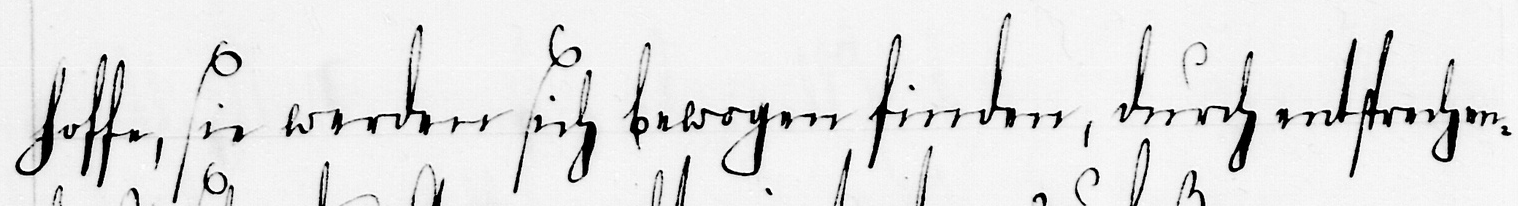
hoffe, sie werden sich bewogen finden, durch entspreche¬
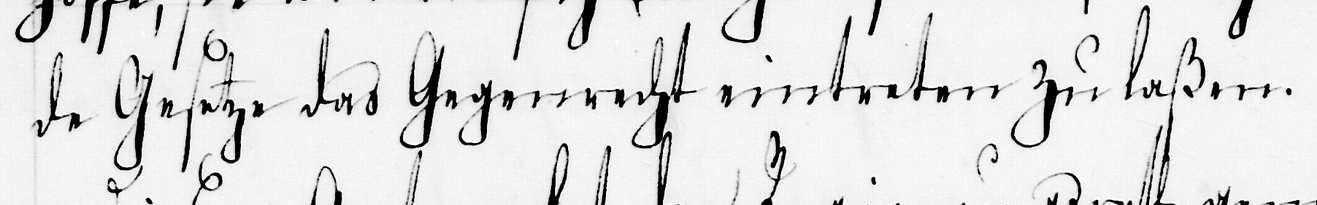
nden Gesetze das Gegenrecht eintreten zu laßen.
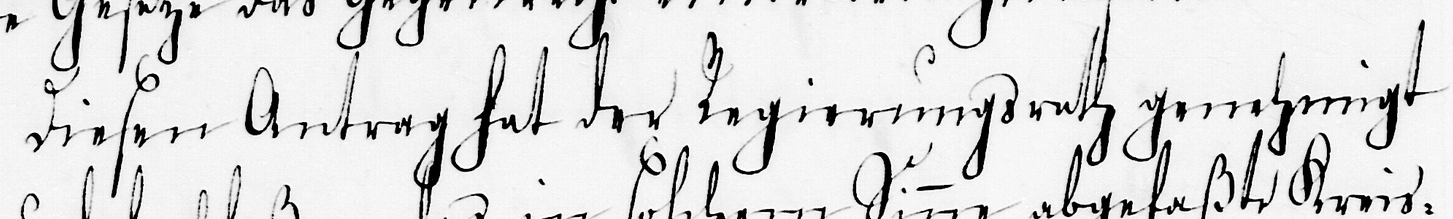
Diesen Antrag hat der Regierungsrath genehmigt
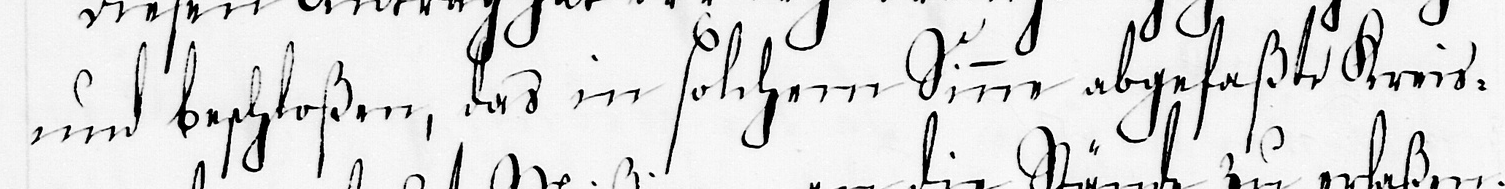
und beschloßen, das in solchem Sinne abgefaßte Kreis¬
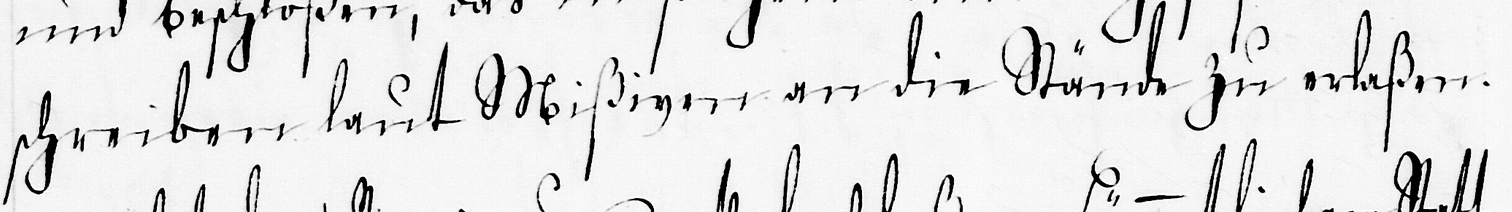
schreiben laut Mißiven an die Stände zu erlaßen.
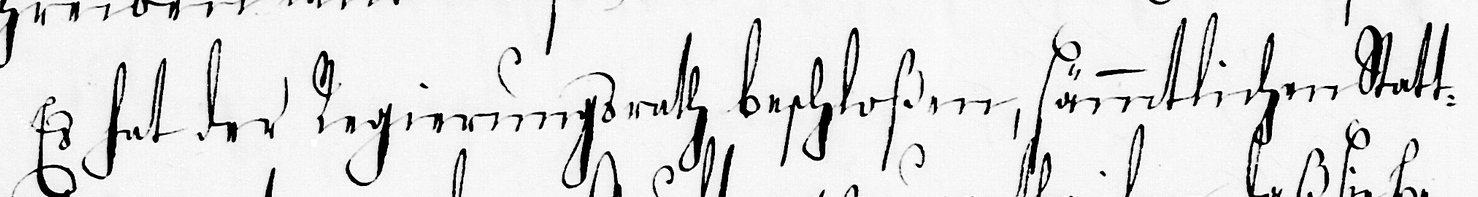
Es hat der Regierungsrath beschloßen, sämmtlichen Stat¬
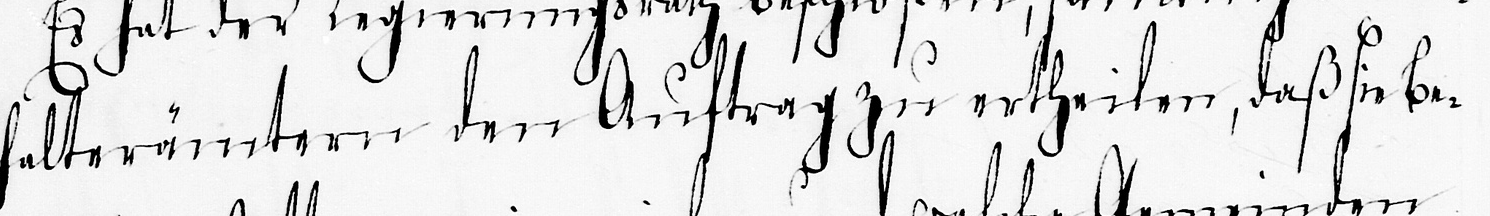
alterämtern den Auftrag zu ertheilen, daß sie Be¬
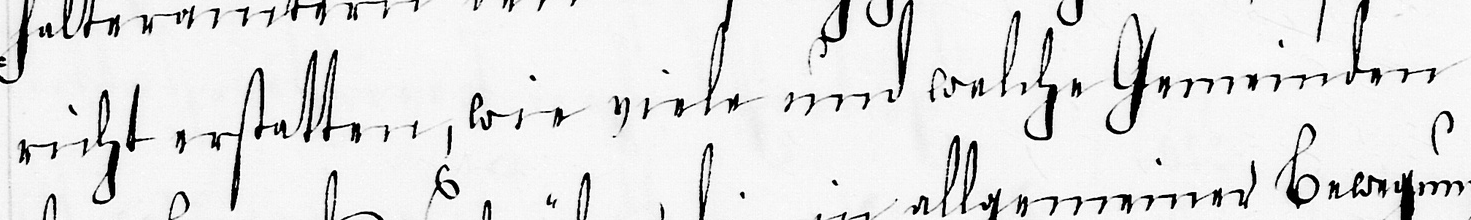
richt erstatten, wie viele und welche Gemeinden
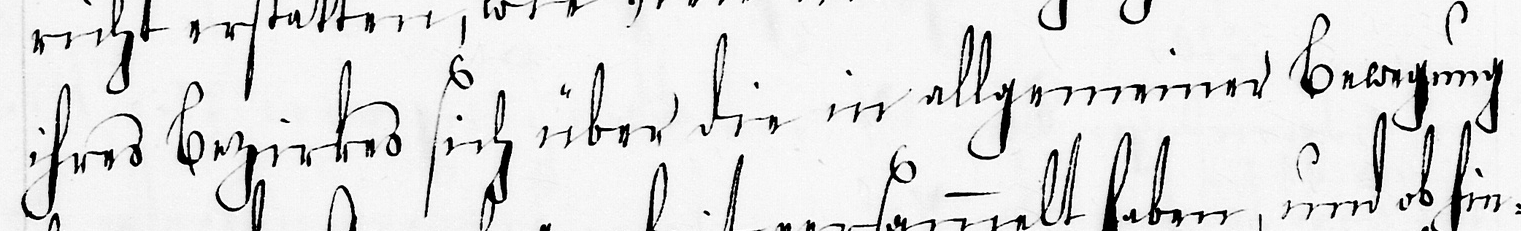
ihres Bezirkes sich über die in allgemeiner Bewegung
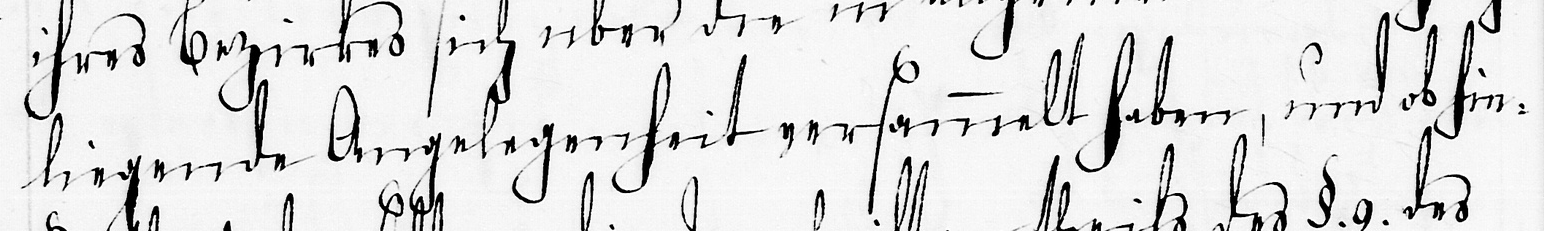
liegende Angelegenheit versammelt haben, und ob hin¬
